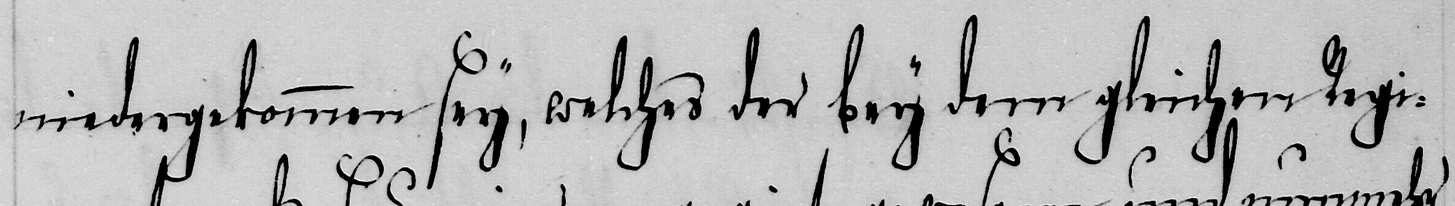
niedergekommen sey, welches der bey dem gleichen Regi¬
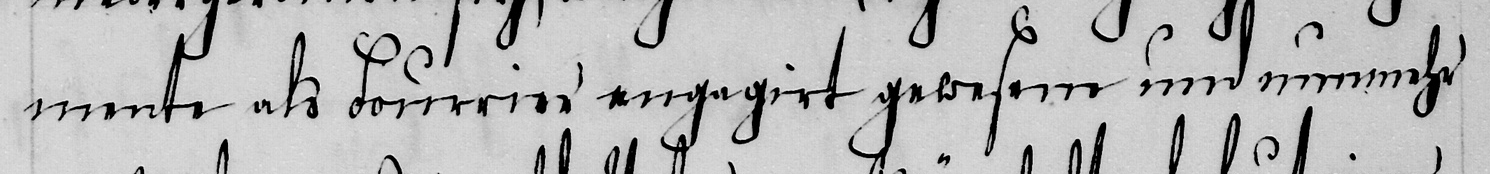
mente als Fourrier engagirt gewesene und nunmehr
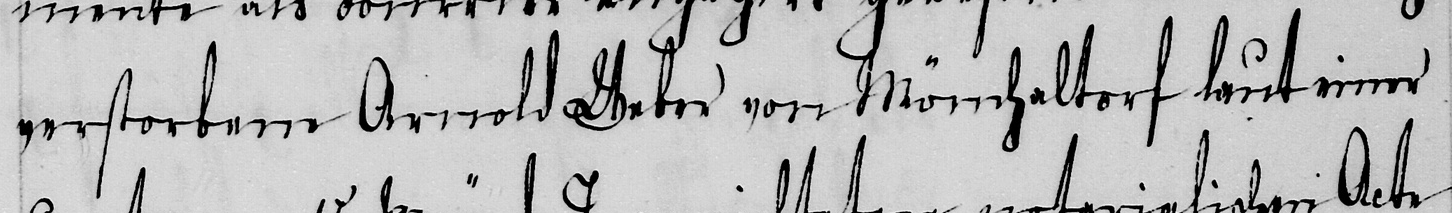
verstorbene Arnold Weber von Möchaltorf laut einer
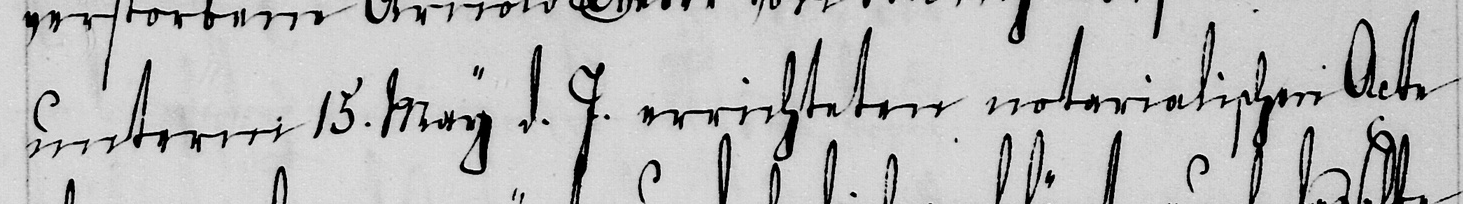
unterm 15. May d. J. errichteten notarialischen Acte
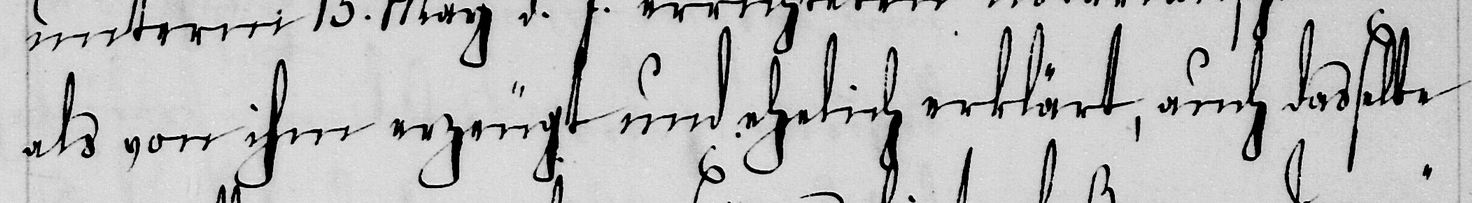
als von ihm erzeugt und ehelich erklärt, auch dasselbe
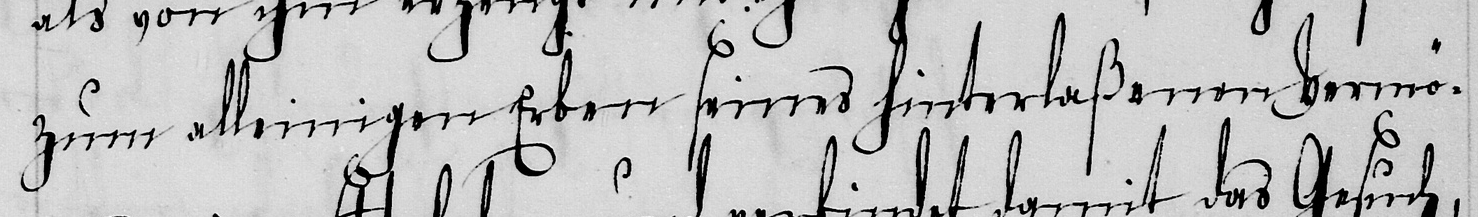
zum alleinigen Erben seines hinterlaßenen Vermö¬
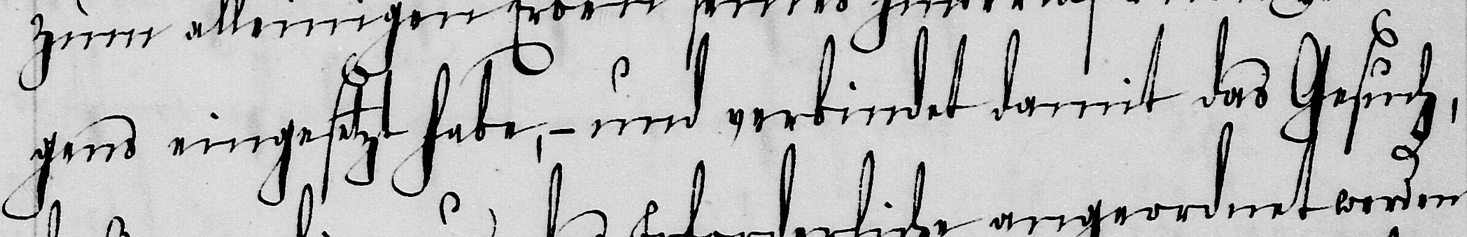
gens eingesetzt habe, – und verbindet damit das Gesuch,
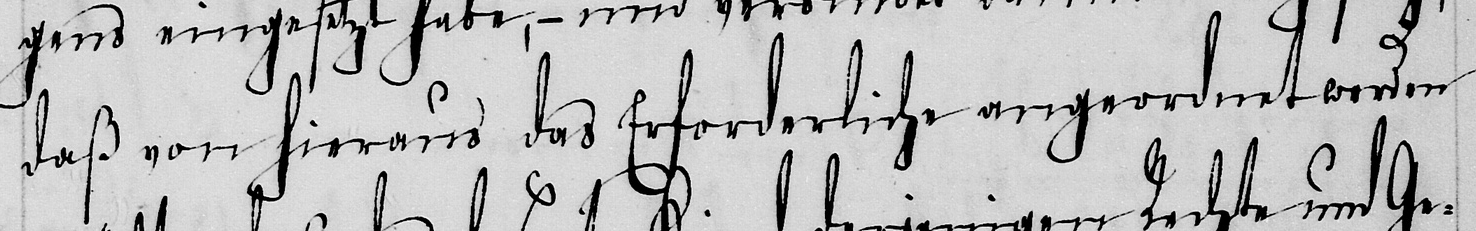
daß von hieraus das Erforderliche angeordnet werden
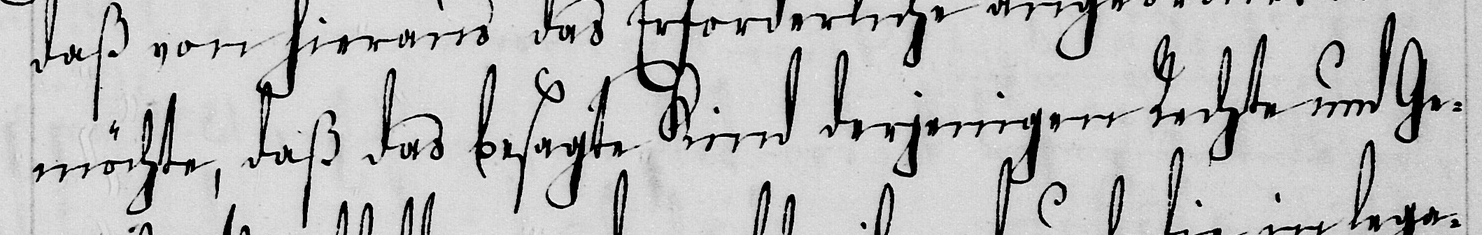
möchte, daß das besagte Kind derjenigen Rechte und G¬
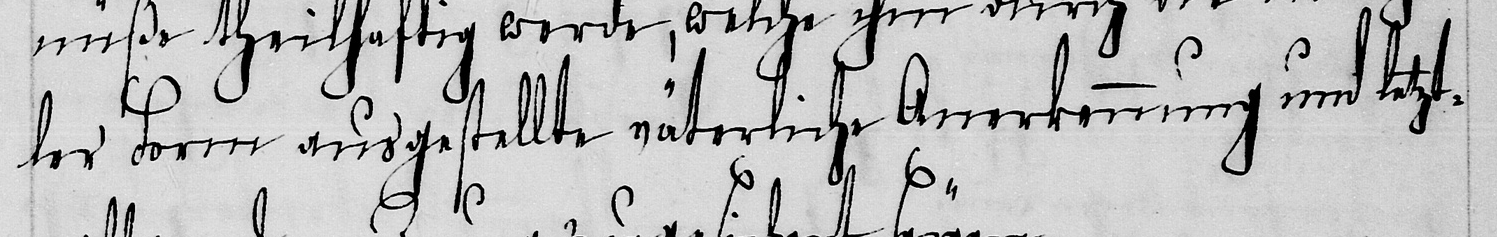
ler Form ausgestellte väterliche Anerkennung und letzt¬
